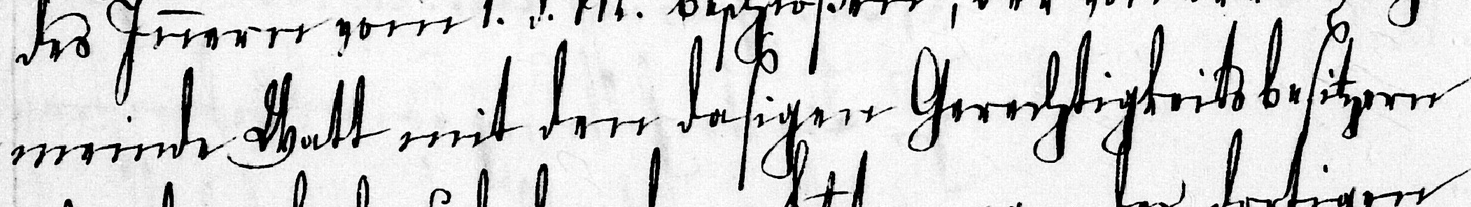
meinde Watt mit den dasigen Gerechtigkeitsbesitzern
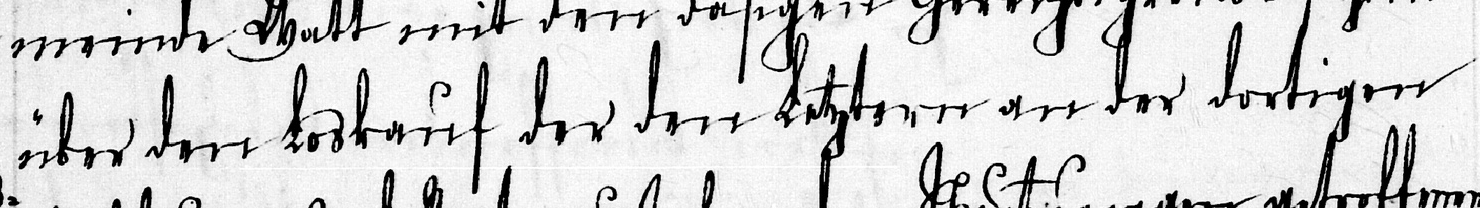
über den Loskauf der den Letztern an der dortigen
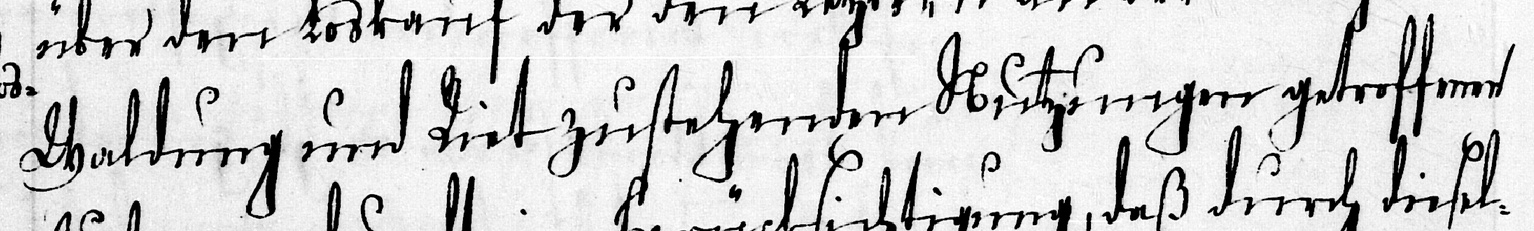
Waldung und Riet zustehenden Nutzungen getroffen¬
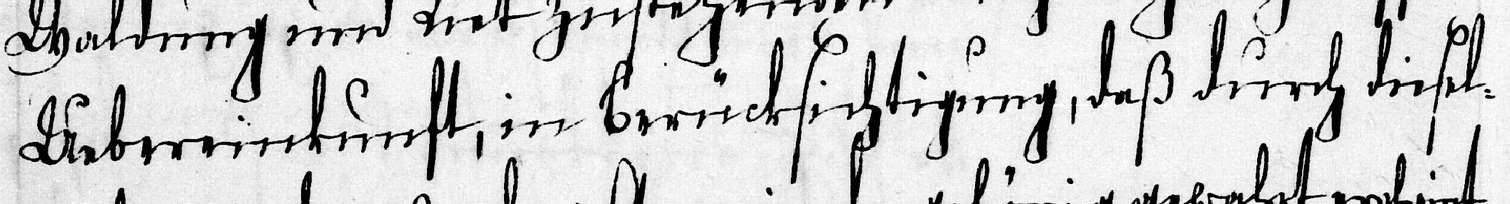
Uebereinkunft, in Berücksichtigung, daß durch diese¬
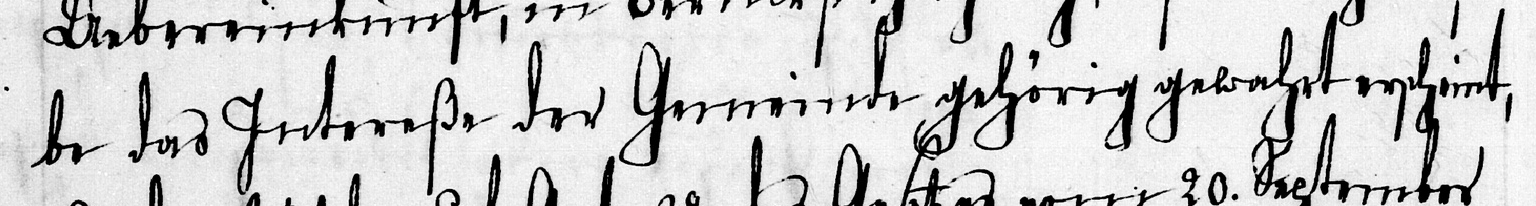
lbe das Intereße der Gemeinde gehörig gewahrt erscheint,
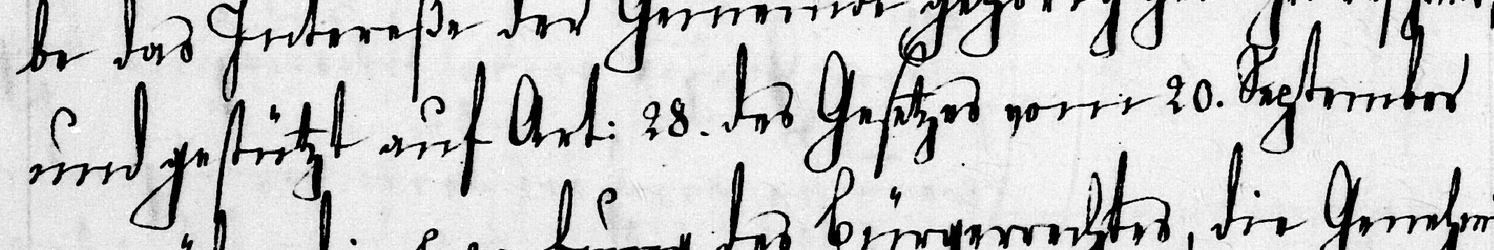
und gestützt auf Art: 28. des Gesetzes vom 20. September
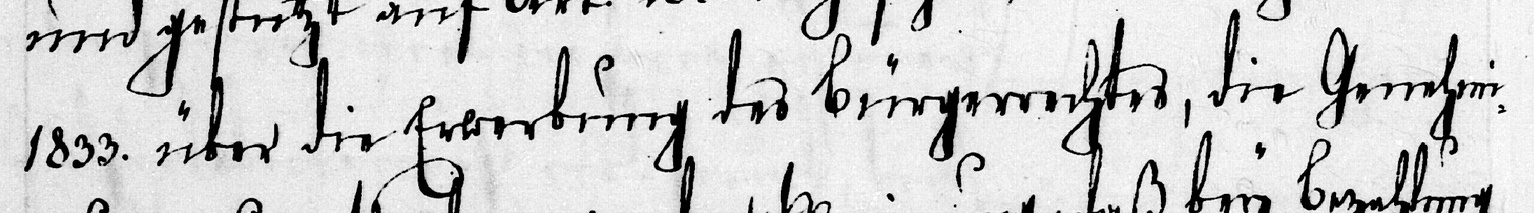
1833. über die Erwerbung des Bürgerrechtes, die Genehmi¬
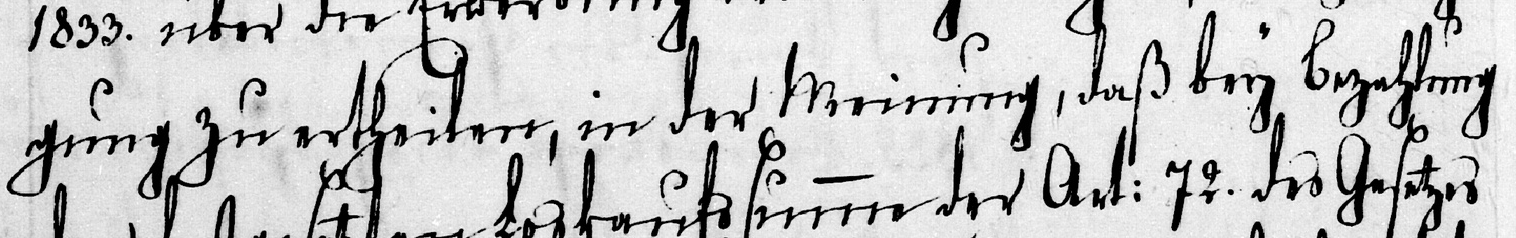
gung zu ertheilen, in der Meinung, daß bey Bezahlung
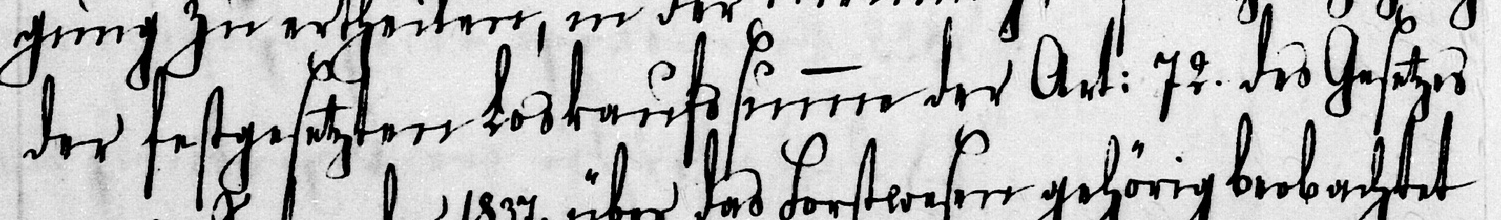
der festgesetzten Loskaufssumme der Art: 72. des Gesetzes
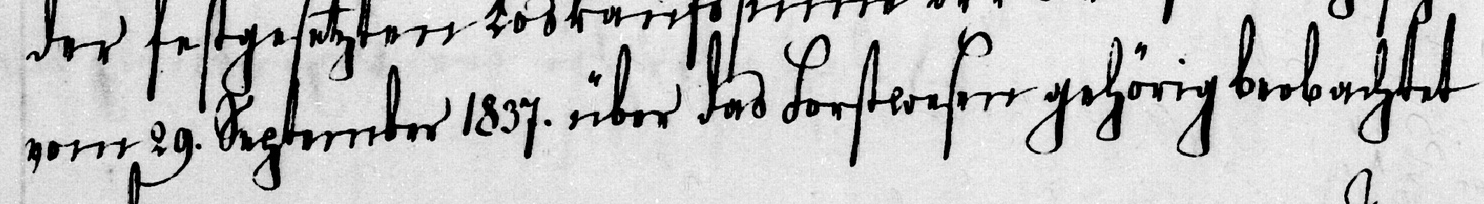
vom 29. September 1837. über das Forstwesen gehörig beobachtet
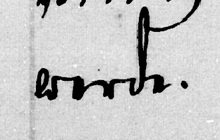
werde.
